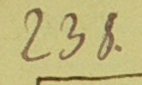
238
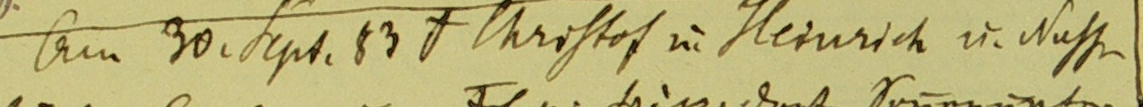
Am 30. Sept. 83 mit Christof und Heinrich und Nuss¬
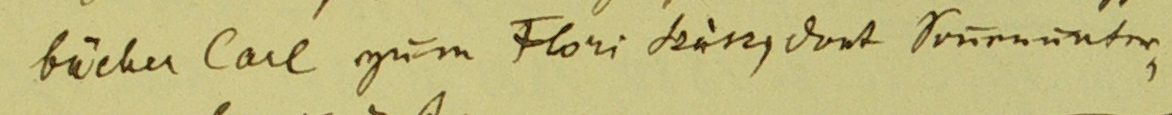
bächer Carl zum Flori Szasz, dort Sonnenunter¬
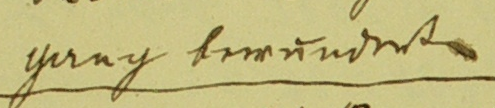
gang bewundert.
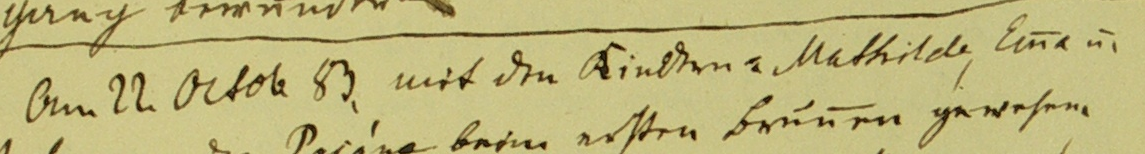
Am 22. Oktob. 83 mit den Kindern und Mathilde, Emma und
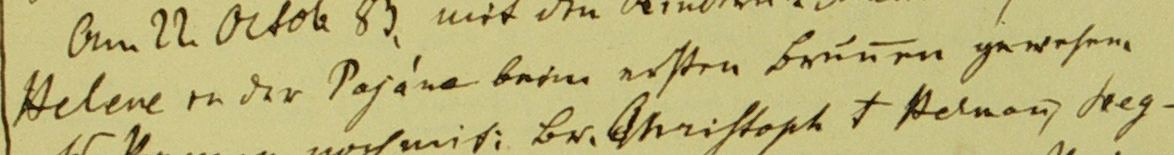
Helene in der Pojana beim ersten Brunnen gewesen.
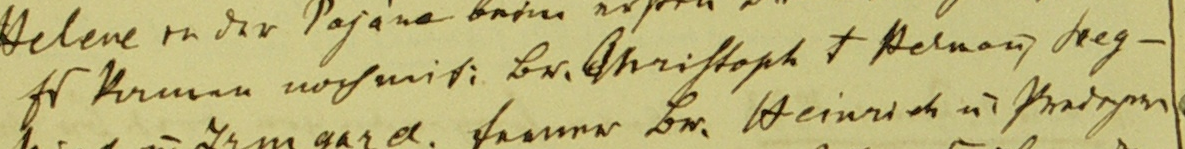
Es kommen noch mit , Br. Christof mit Herman, Sieg¬
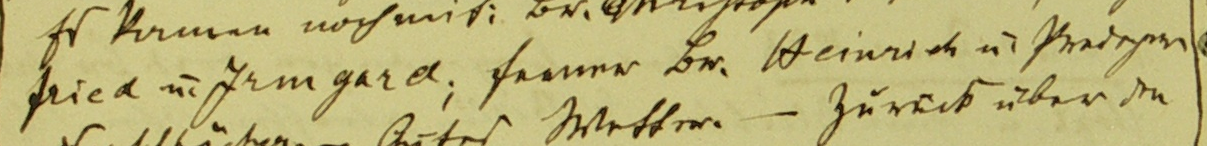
fried und Irmgard; ferner Br. Heinrich und Prediger
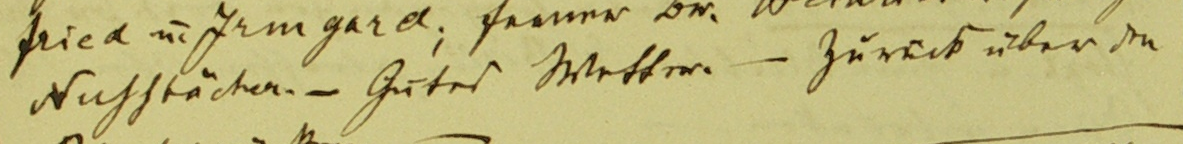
Nussbächer. - Gutes Wetter - Zurück über den
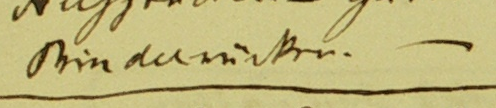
Binderrücken.—
